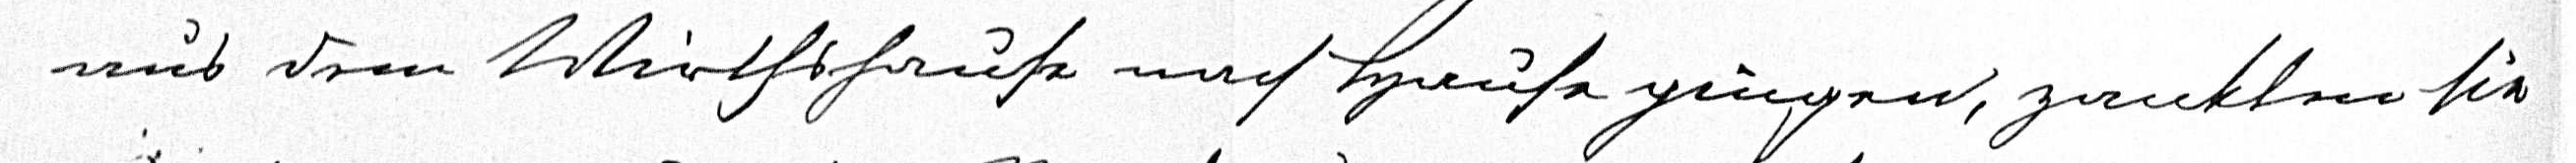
aus dem Wirthshause nach Hause gingen, zankten sie
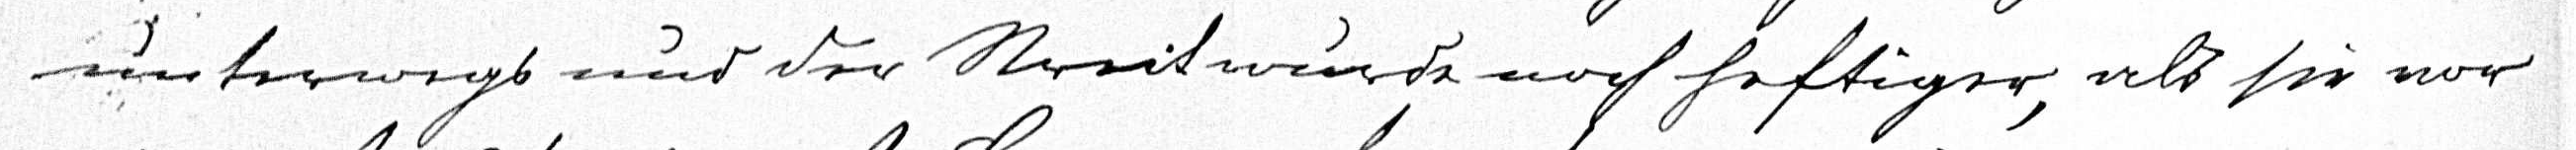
unterwegs und der Streit wurde noch heftiger, als sie vor
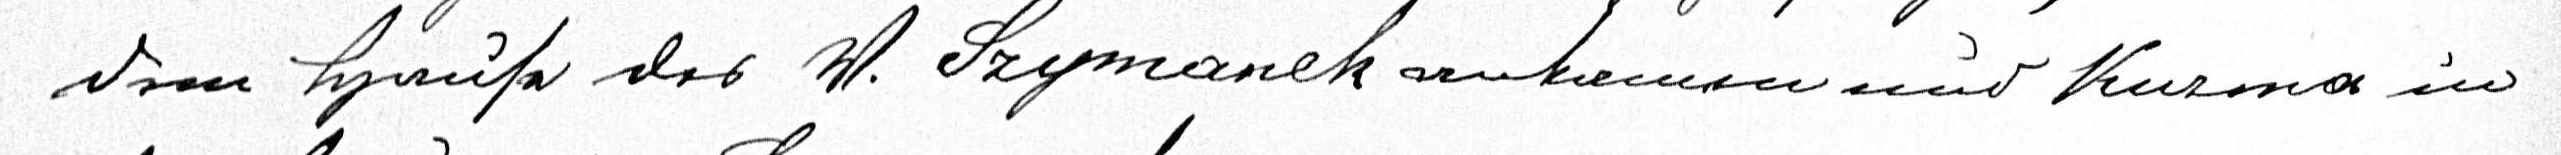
dem Hause des V. Szymanek ankamen und Kuźma in
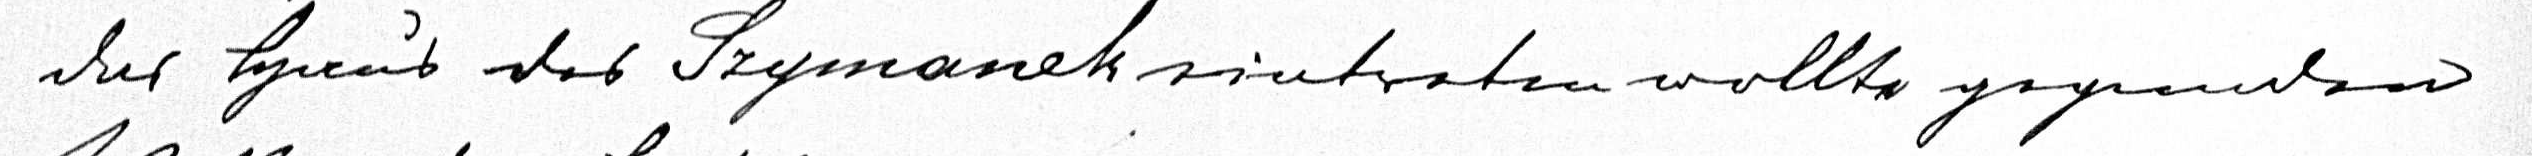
das Haus des Szymanek eintraten wollte gegen den
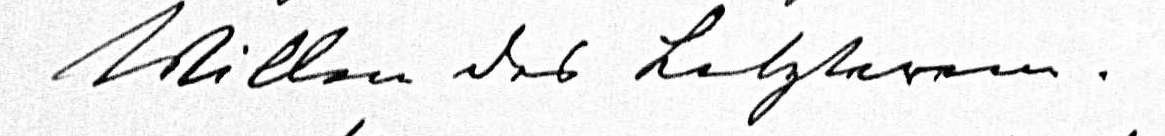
Willen des Letzteren
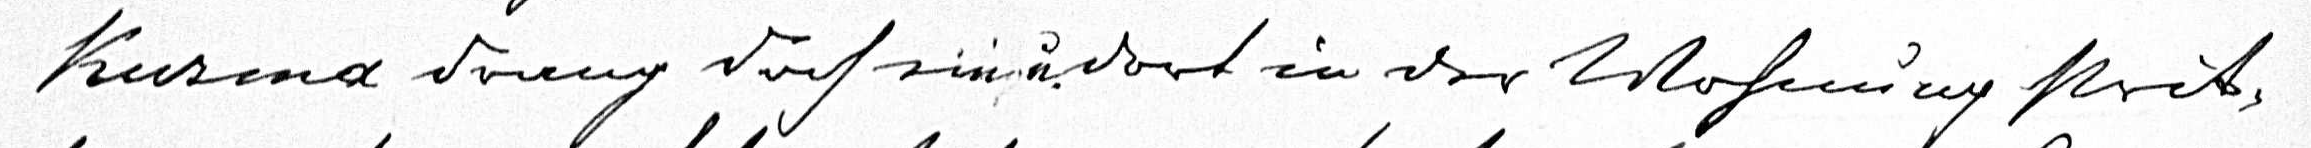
Kuźma drang doch ein u. dort in der Wohnung strit¬
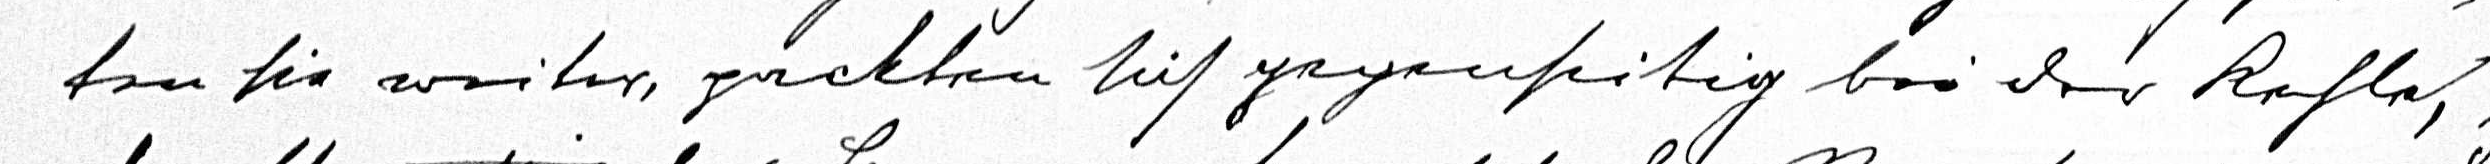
ten sie weiter, packten sich gegenseitig bei der Kehle,
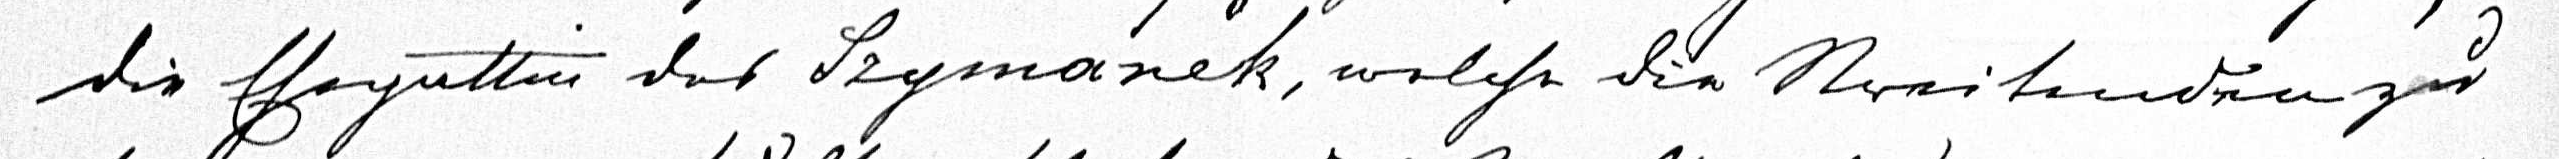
die Ehegattin des Szymanek, welche die Streitenden zu
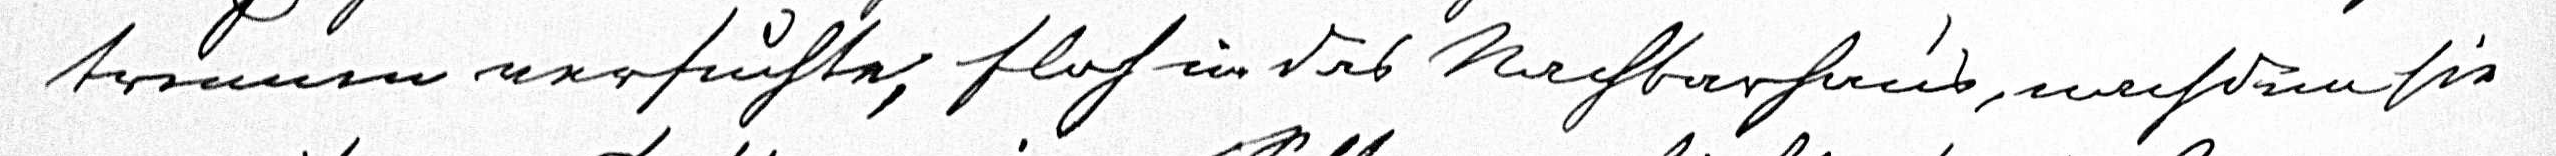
trennen versuchte, floh in das Nachbarhaus, nachde sie
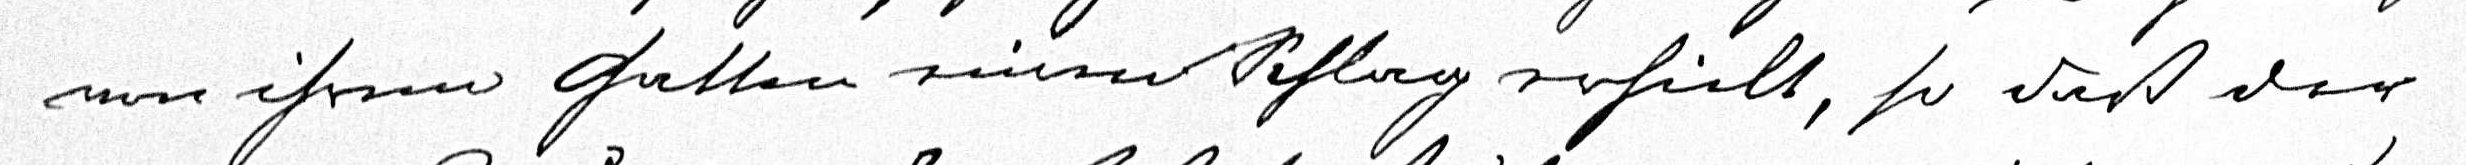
von ihrem Gatten einen Schlag erhielt, so daß der
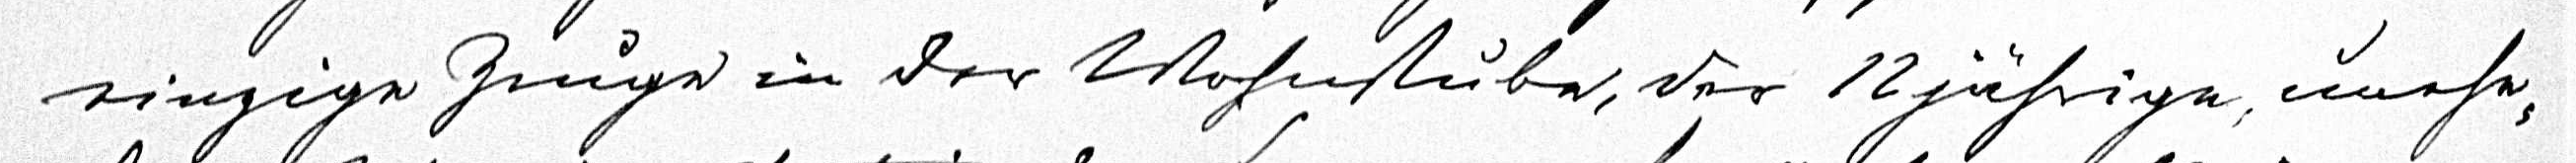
einzige Zeuge in der Wohnstube, der 12jährige, unehe¬
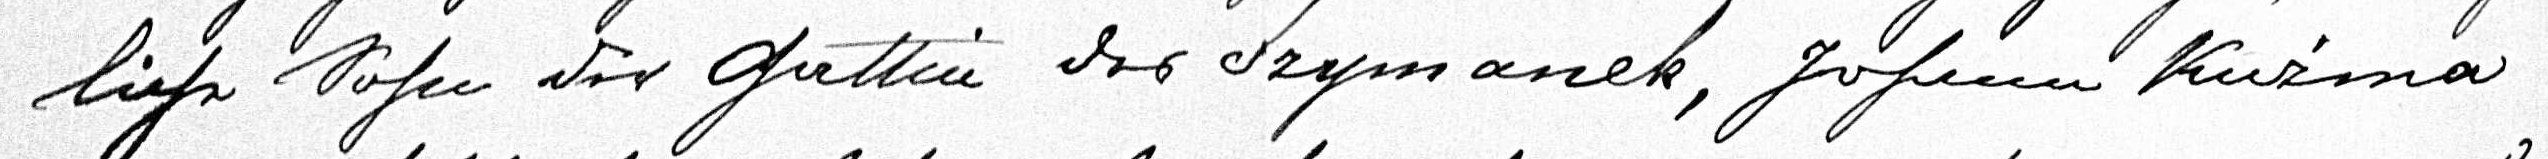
liche Sohn der Gattin des Szymanek, Johann Kuźma
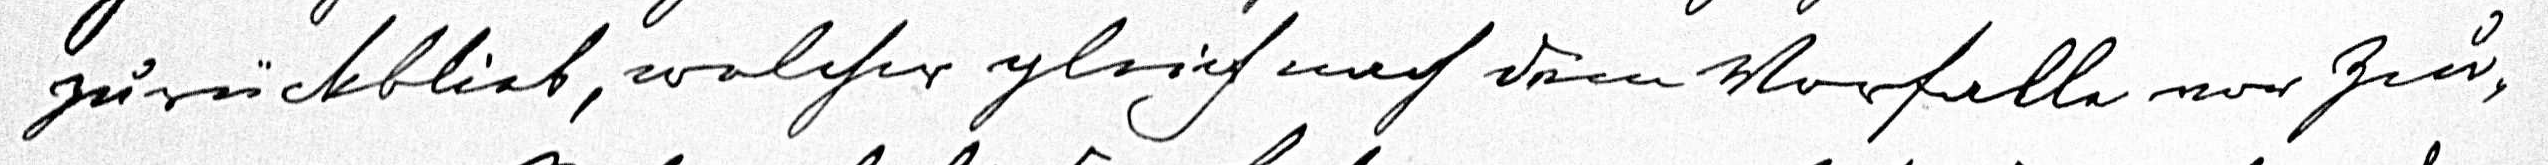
zurückblieb, welcher gleich nach dem Vorfalle vor Zeu¬
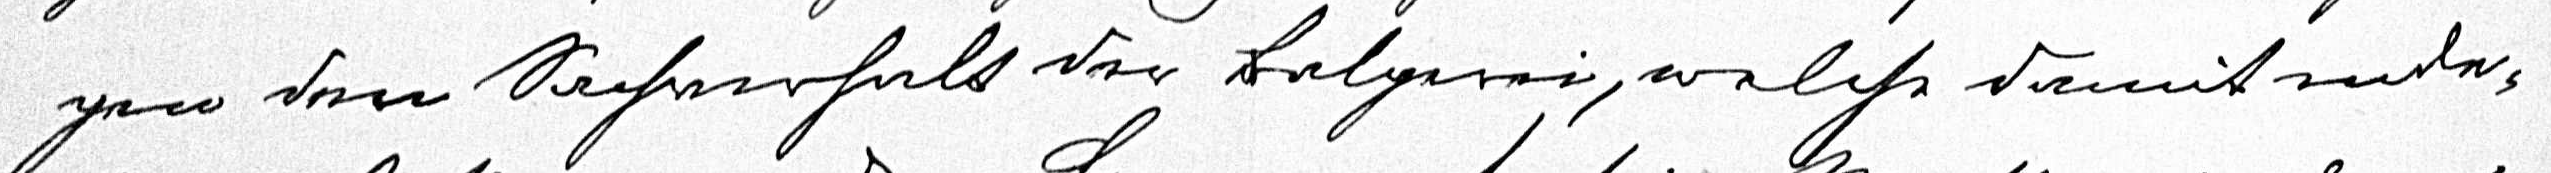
gen den Sachverhalt der Balgerei, welche damit ende¬
